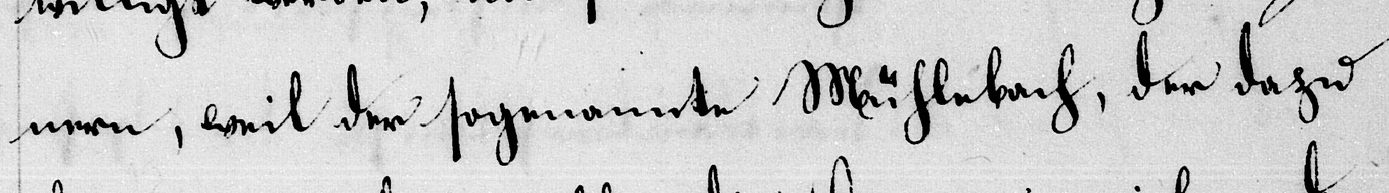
nern, weil der sogenannte Mühlebach, der dazu
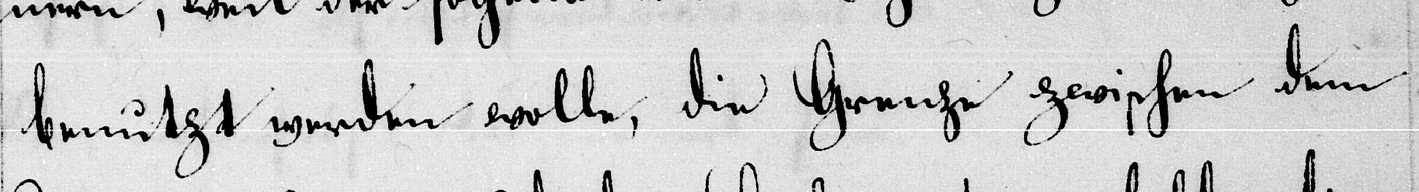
benutzt werden wolle, die Grenze zwischen dem
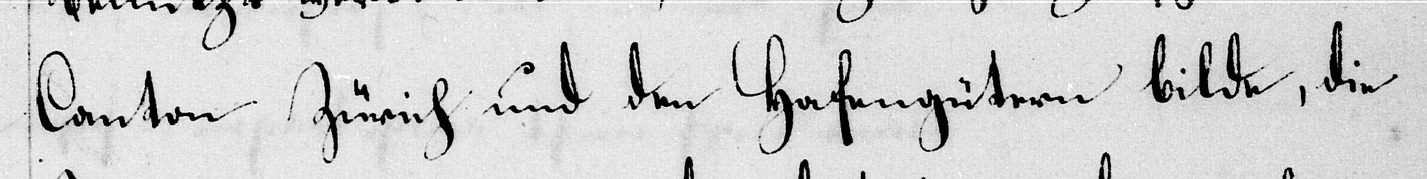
Canton Zürich und den Hafengütern bilde, die
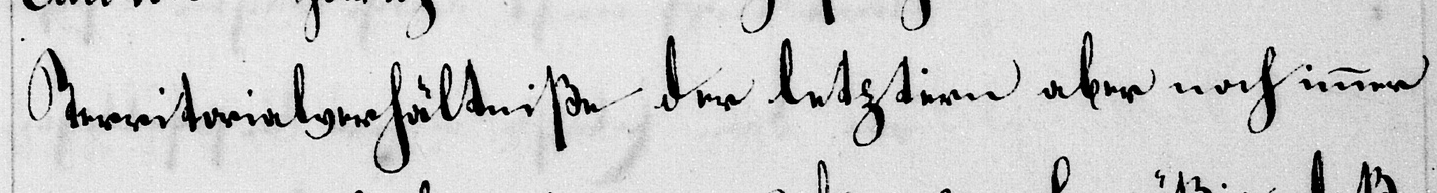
Territorialverhältniße der letztern aber noch immer
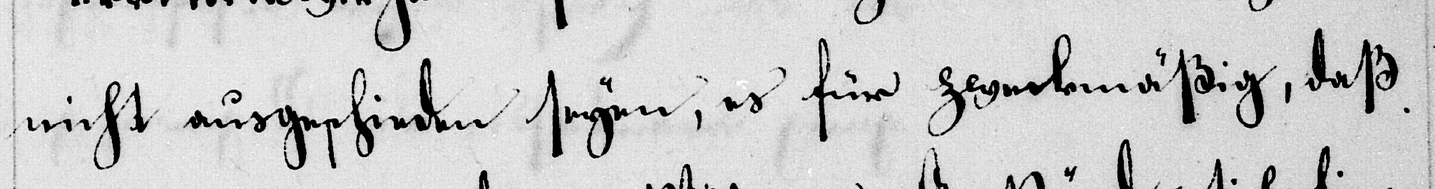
nicht ausgeschieden seyen, es für zweckmäßig, daß
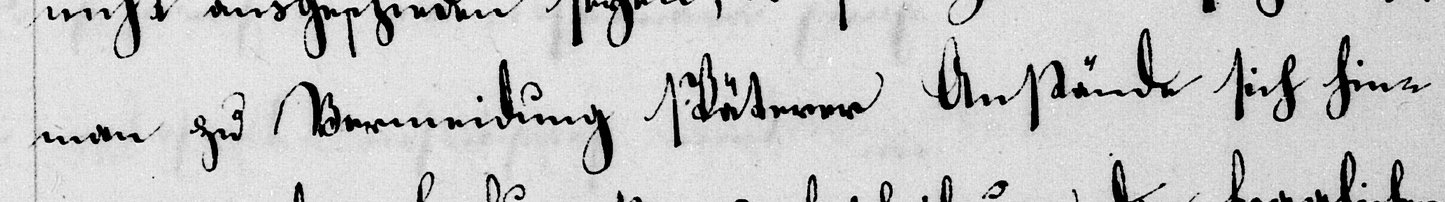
man zu Vermeidung späterer Anstände sich hin¬
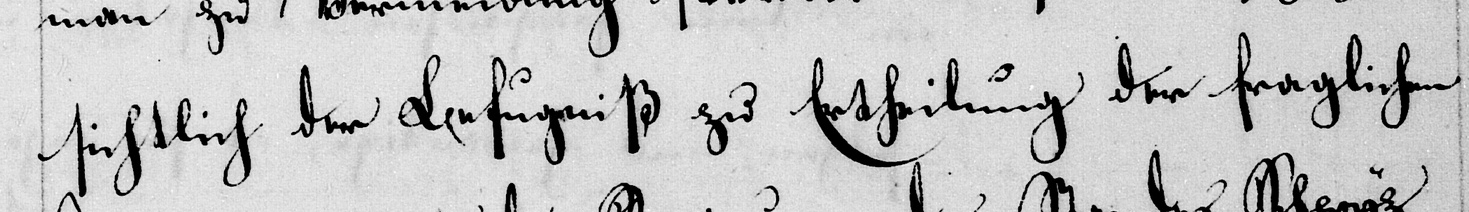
sichtlich der Befugniß zu Ertheilung der fraglichen
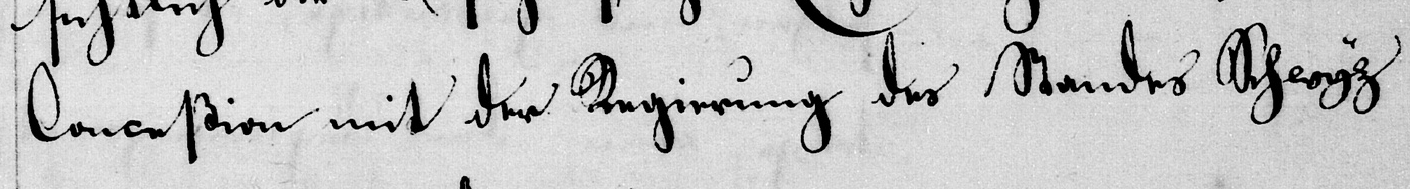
Conceßion mit der Regierung des Standes Schwyz
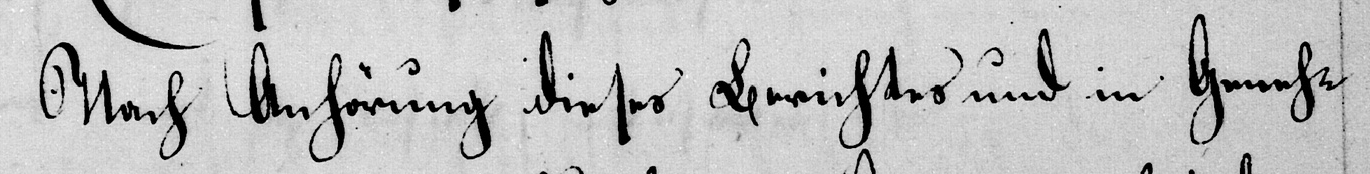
Nach Anhörung dieses Berichtes und in Geneh¬
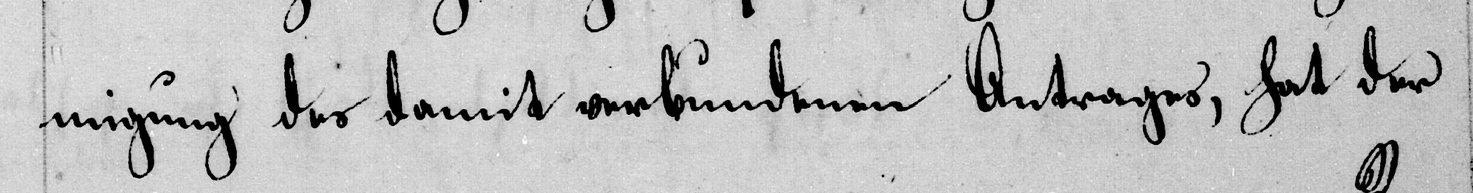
migung des damit verbundenen Antrages, hat der
